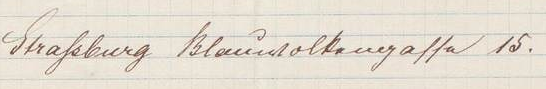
Strassburg Blauwolkengasse 15.
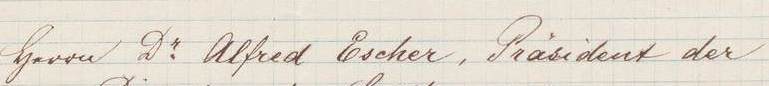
Herrn Dr Alfred Escher, Präsident der
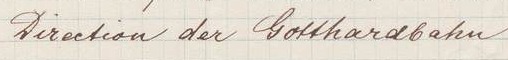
Direction der Gotthardbahn
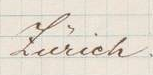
Zürich.
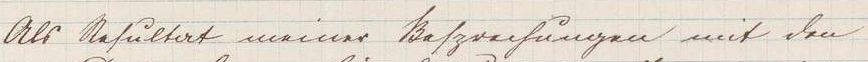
Als Resultat meiner Besprechungen mit den
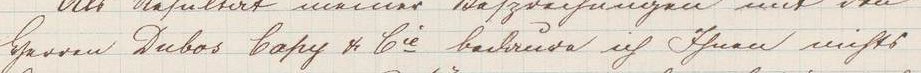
Herren DubosCapy & Cie bedaure ich Ihnen nichts
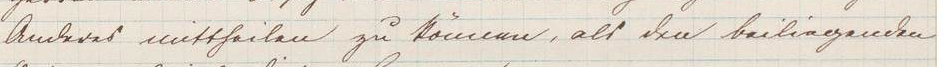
Anderes mittheilen zu können, als den beiliegenden
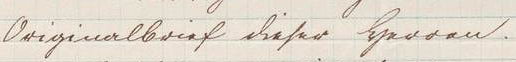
Originalbrief dieser Herren.
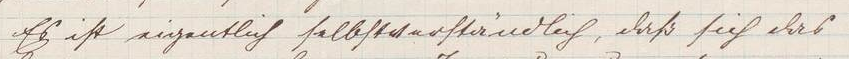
Es ist eigentlich selbstverständlich, daß sich das
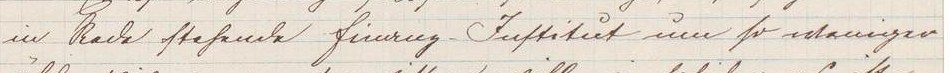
in Rede stehende Finanz–Institut um so weniger
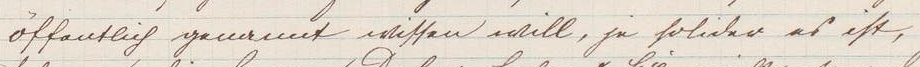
öffentlich genannt wissen will, je solider es ist,
